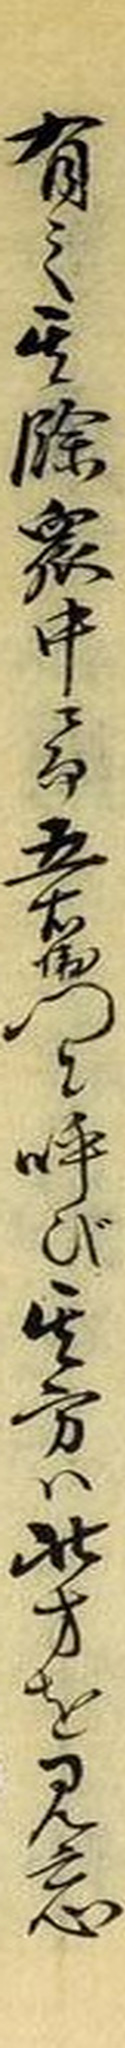有之其余衆中ニ而五右衛門と呼び其方ハ此方を見忘
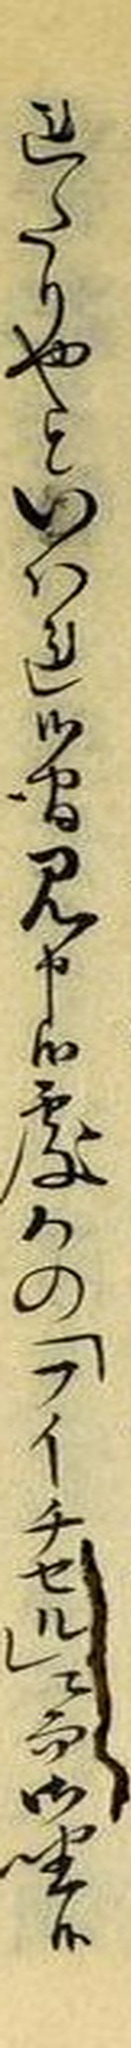れたりやといハれ候間見申候處かの「フイチセル」ニ而御座候
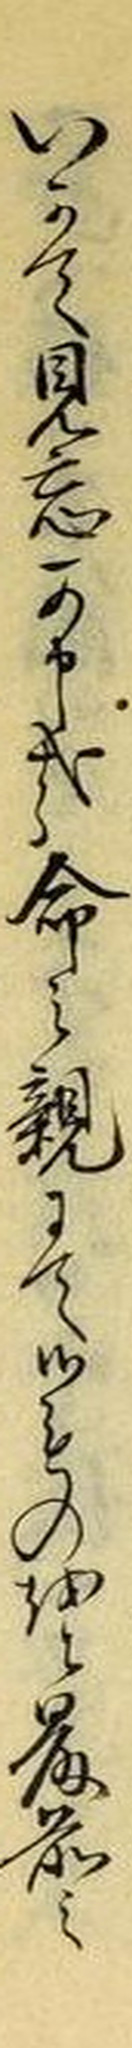いかて見忘可申哉命之親にて候ものをと最前之
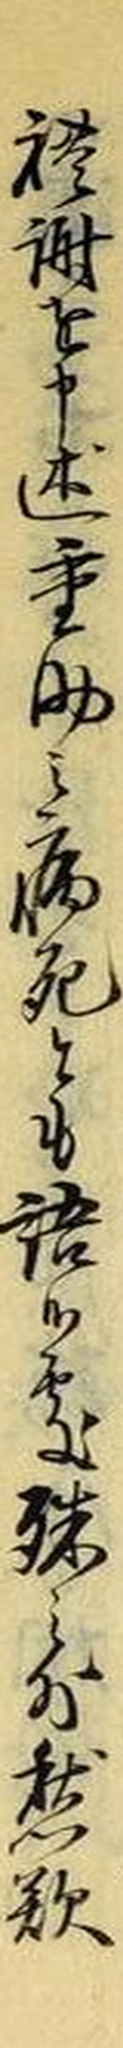礼謝を申述重助之病死とも語候處殊之外愁歎
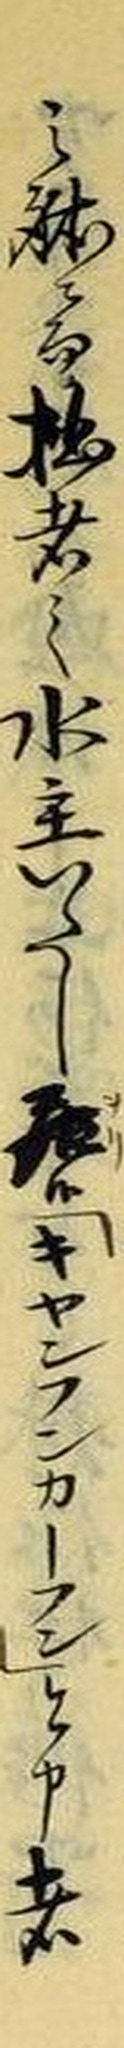之躰ニ而拙者之水主いたし居候「キヤンフンカーフン」と申者
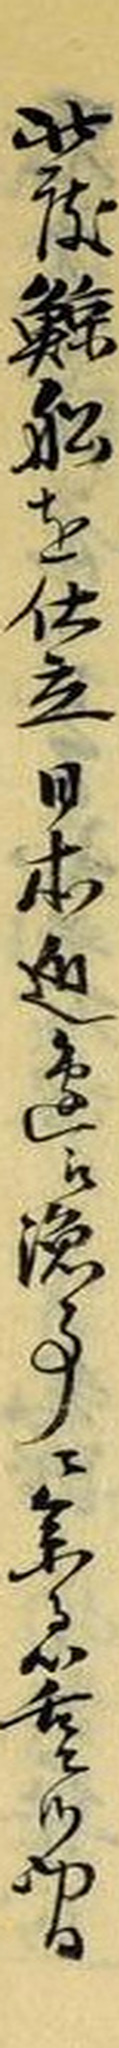此度鯨船を仕立日本近辺江漁事ニ参る筈ニ候間
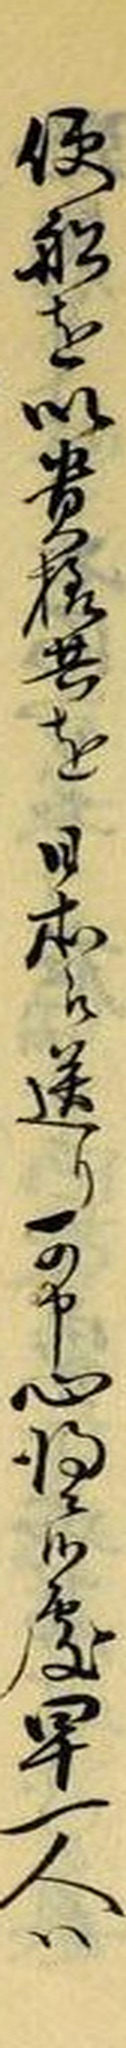便船を以貴様共を日本江送り可申心得ニ候處早一人ハ
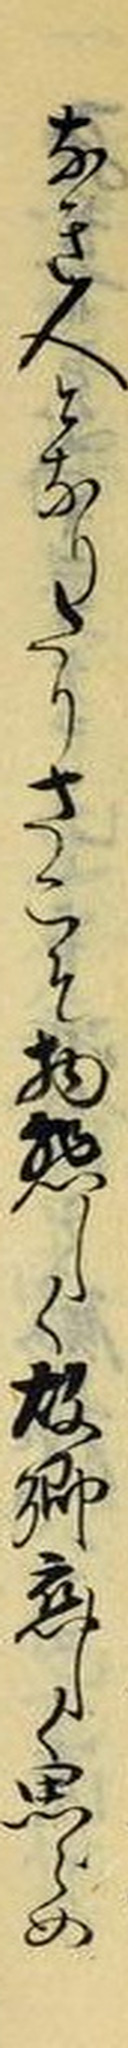なき人となりたりさこそ物悲しく故郷恋しく思らめ
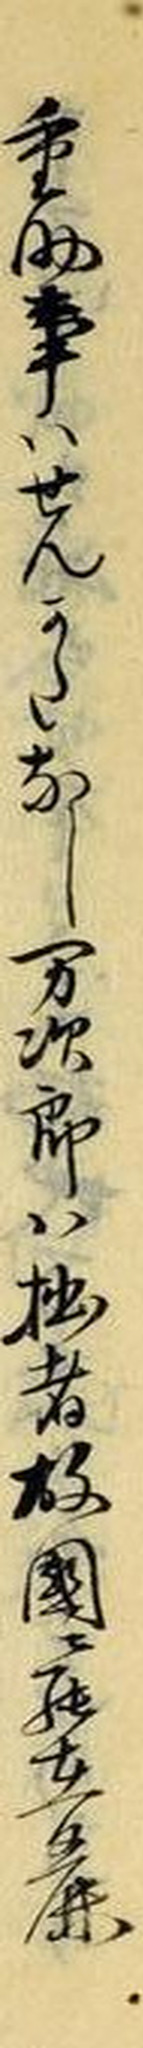重助事ハせんかたなし万次郎ハ拙者故国ニ罷在麁
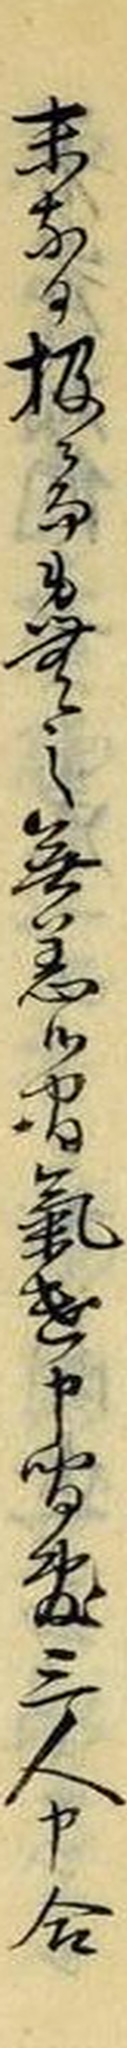末なる扱ニ而も無之無恙候間気遣申間敷三人申合
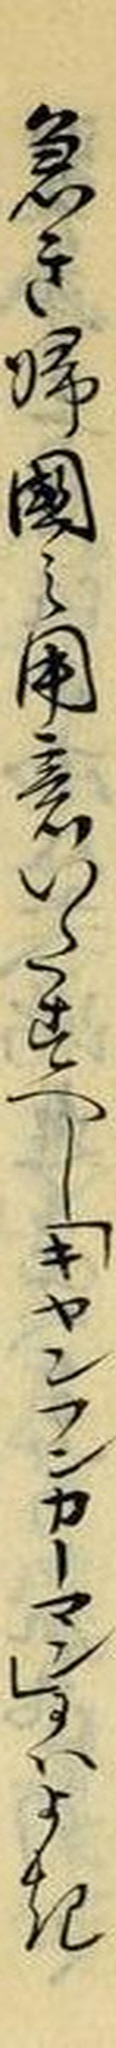急き帰国之用意いたすへし「キャンフンカーマン」にハよき
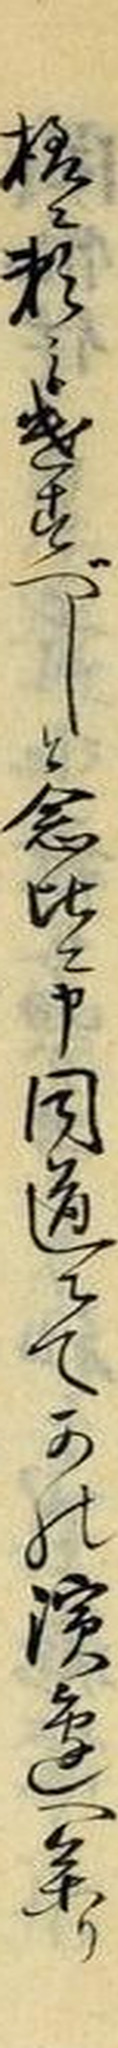様ニ頼み遣すべしと念頃二申同道ニてかの浜辺へ参り
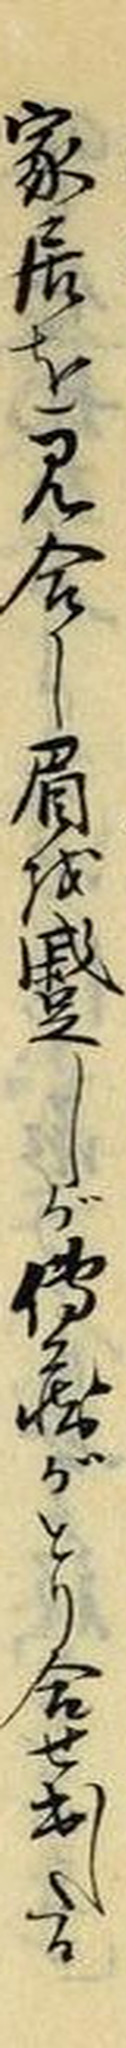家居を見合し眉を蹙しが傳蔵がとり合せ出したる
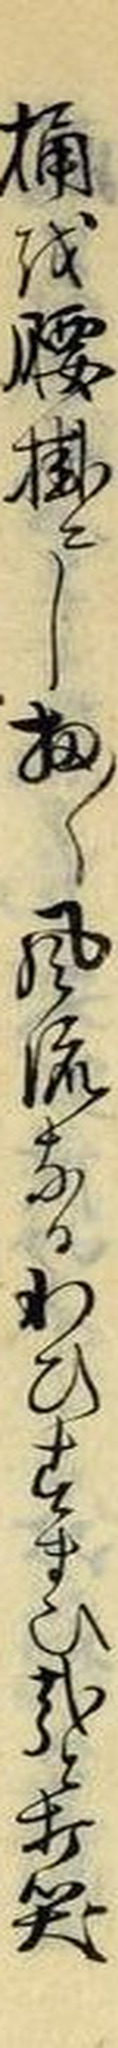桶を腰掛ニし扨〳〵風流なるわひすまひ哉と打笑
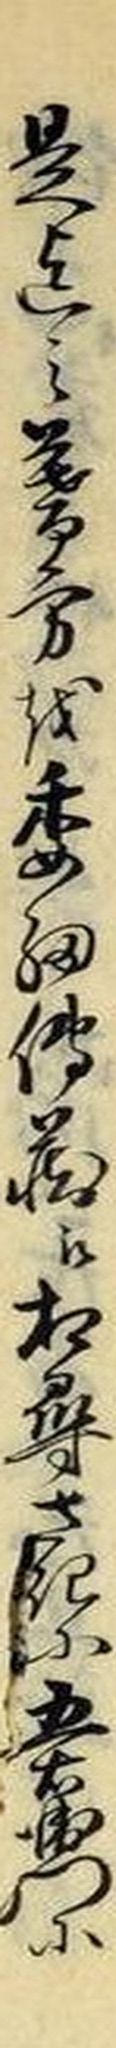是迄之暮方を委細傳蔵へ相尋さきに五右衛門に
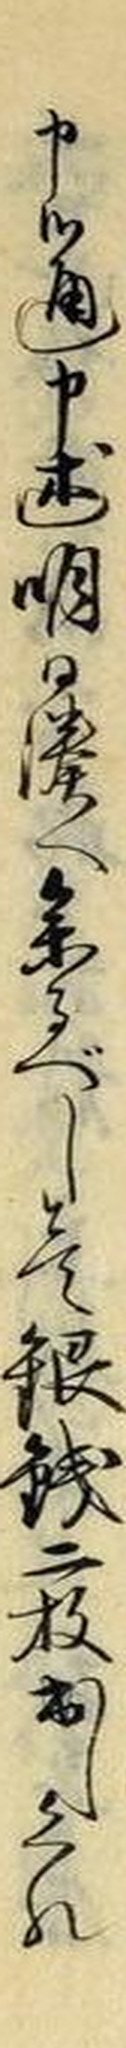申候通申延明日湊へ参るべしとて銀銭二枚出しくれ
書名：漂客談奇（備考雑録写8）
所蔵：福井県文書館 Fukui Prefectural Archives
